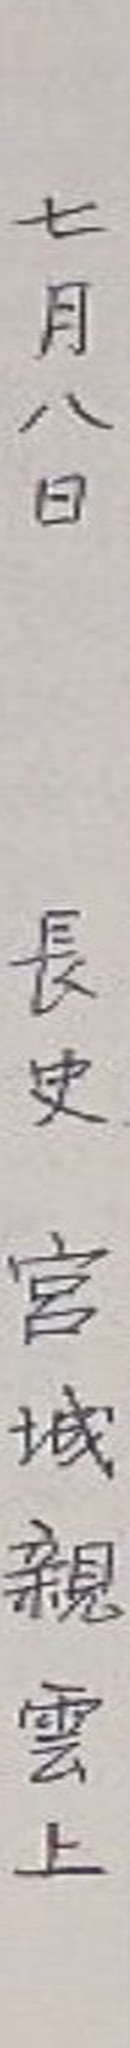七月八日長史宮城親雲上
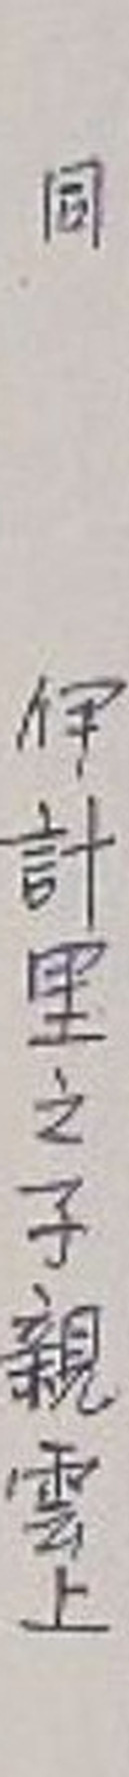同伊計里之子親雲上
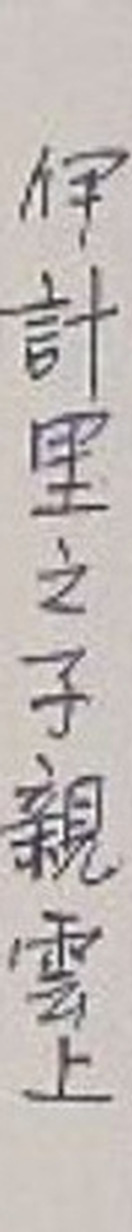同伊計里之子親雲上
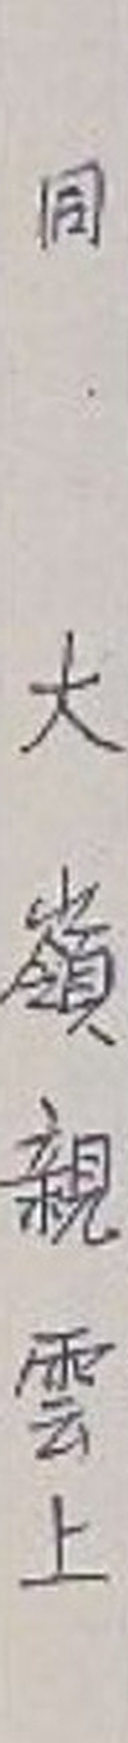同大嶺親雲上
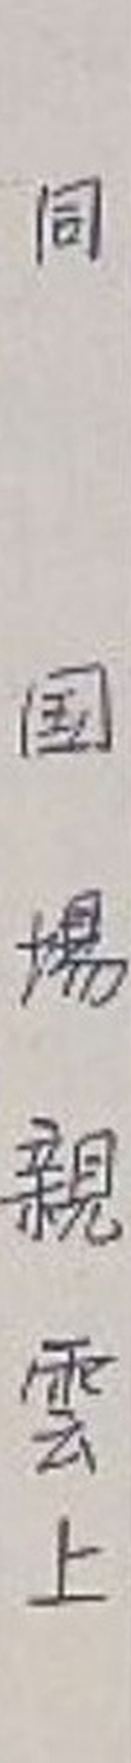同国場親雲上
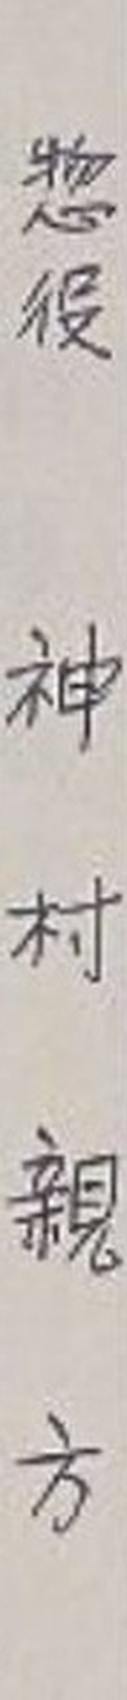惣役神村親方
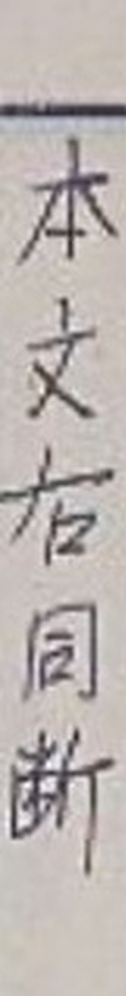本文右同断
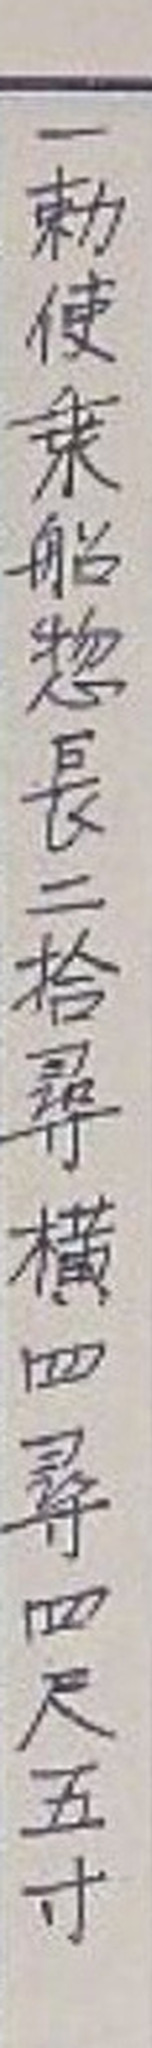一勅使乗船惣長二拾尋横四尋四尺五寸
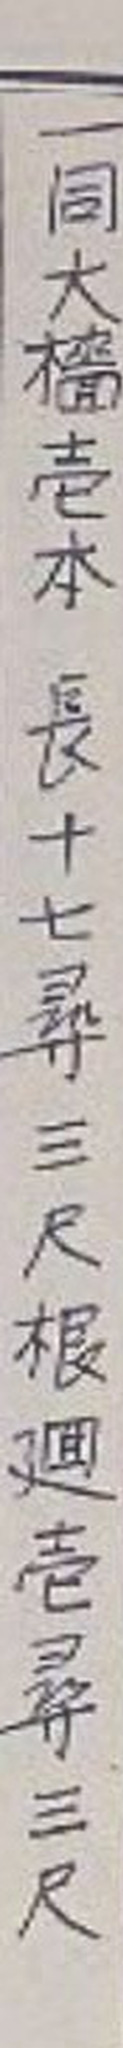一同檣壱本長十七尋三尺根廻壱尋三尺
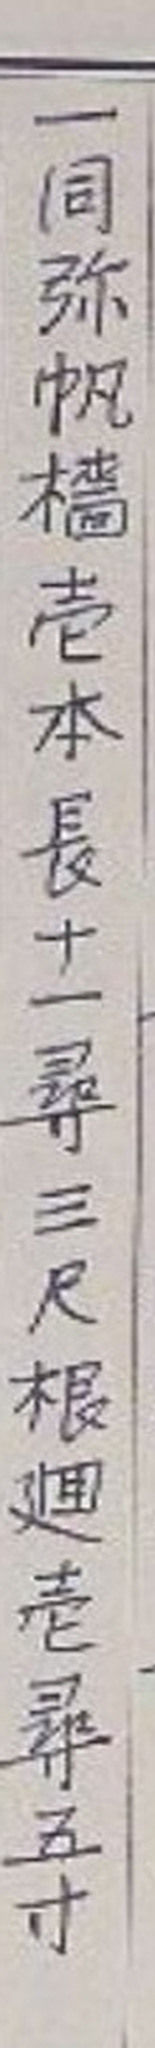一同弥帆檣壱本長十一尋三尺根廻壱尋五寸
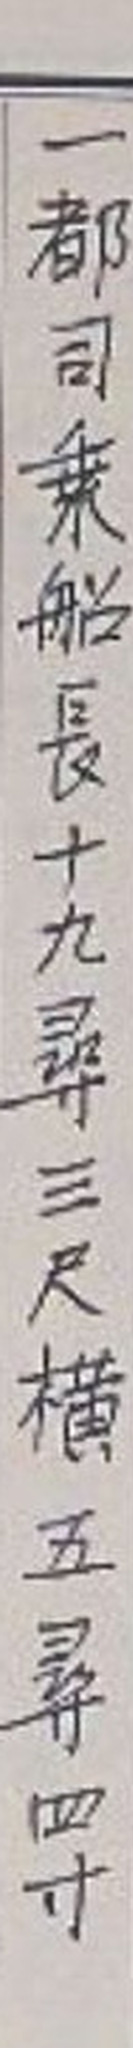一都司乗船長十九尋三尺横五尋四寸
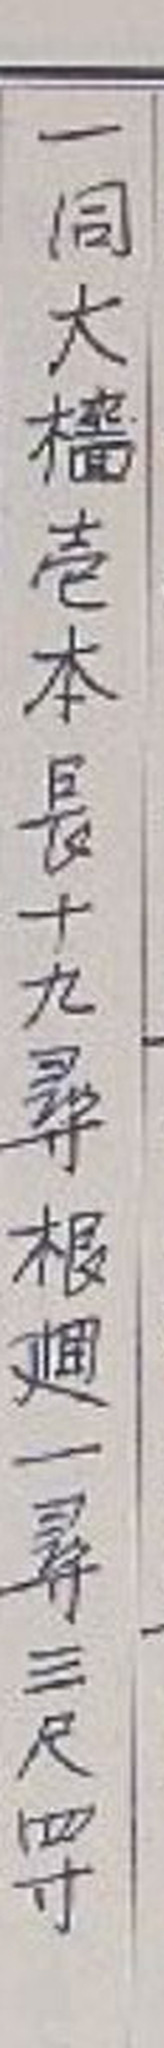一同大檣壱本長十九尋根廻一尋三尺四寸
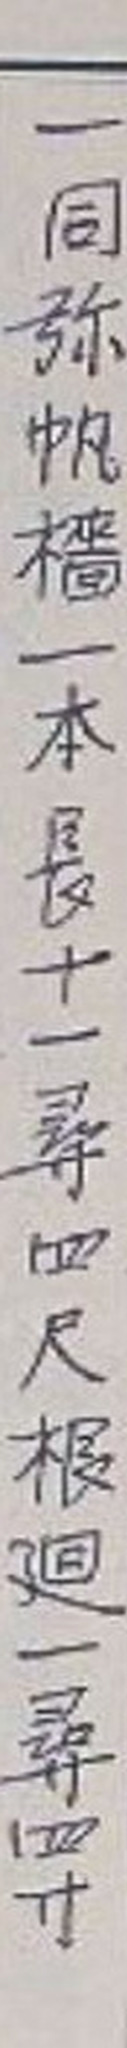一同弥帆檣一本長十一尋四尺根廻一尋四寸
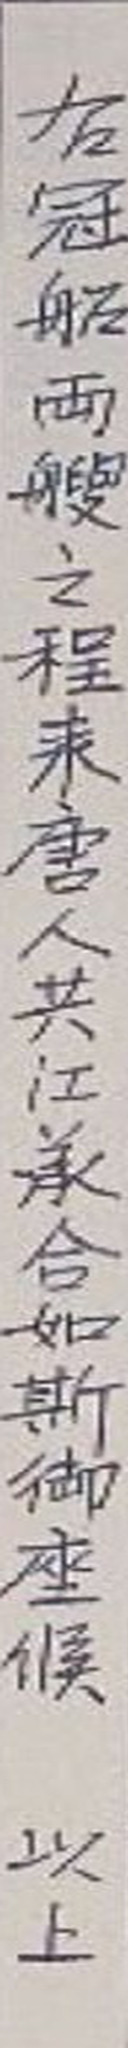右冠船両艘之程来唐人共え承合如斯御座候
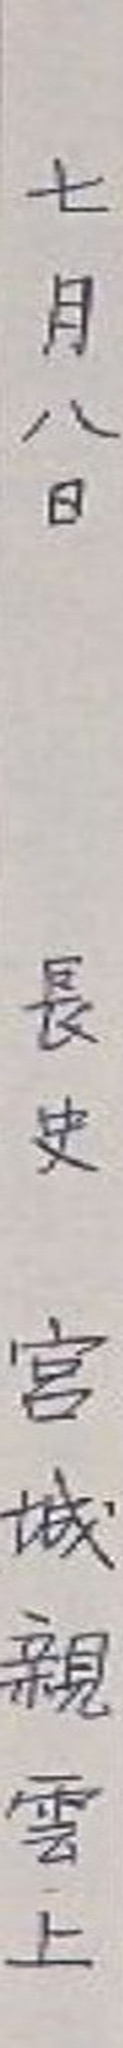七月八日長史宮城親雲上
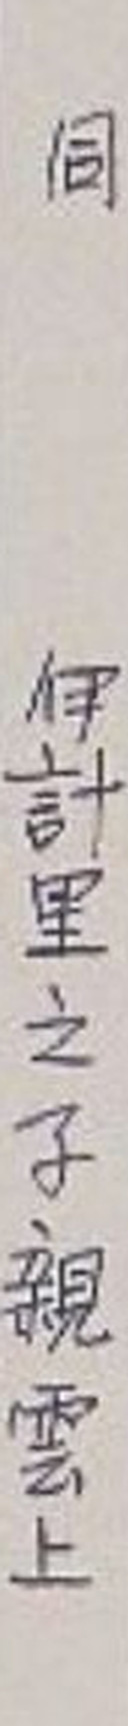同伊計里之子親雲上
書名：支那冊封使来琉諸記 下巻
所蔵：University of the Ryukyus Library
